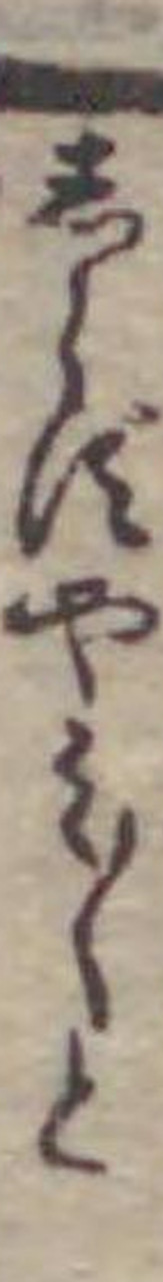しらずやみ〳〵と
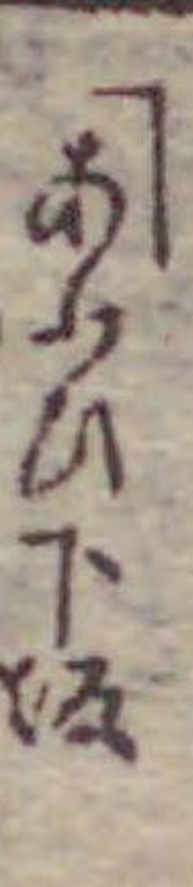〽あふひ下坂
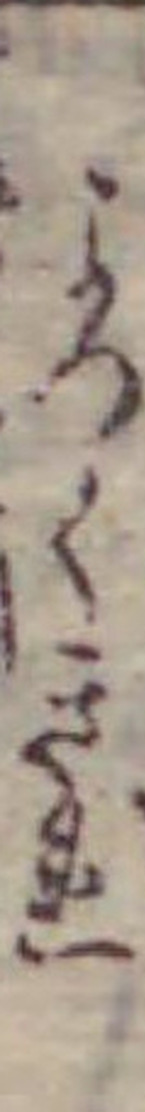ようくきれ
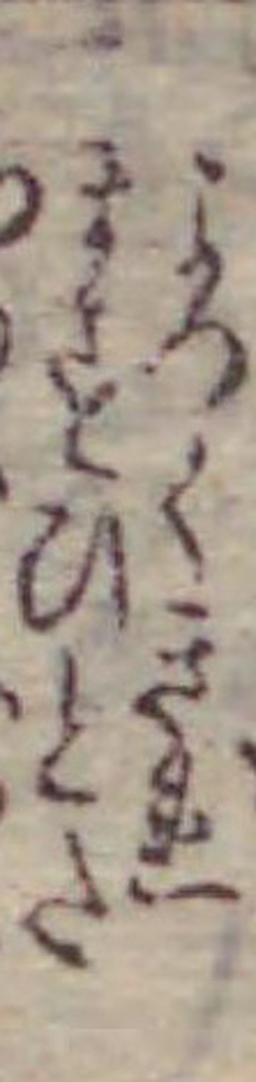ますひとた
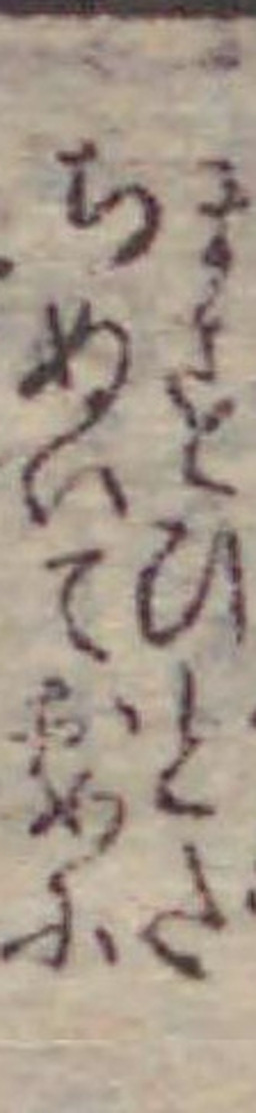ちぬいておめに
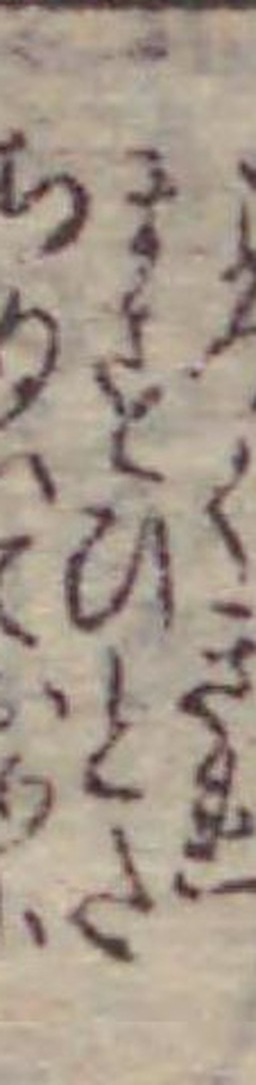ちぬいておめに
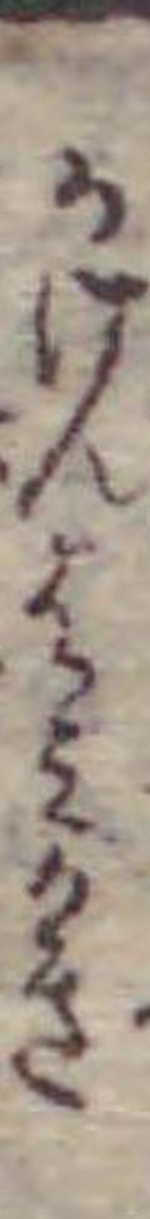かけんはみかき
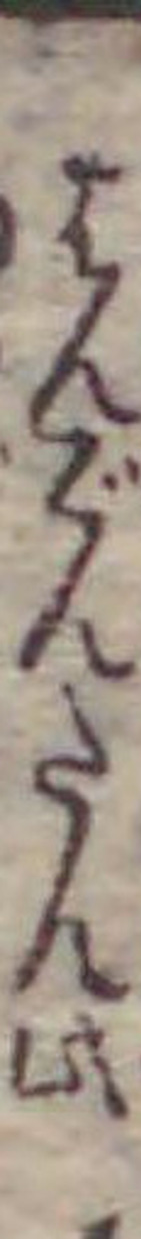はんごんたん此
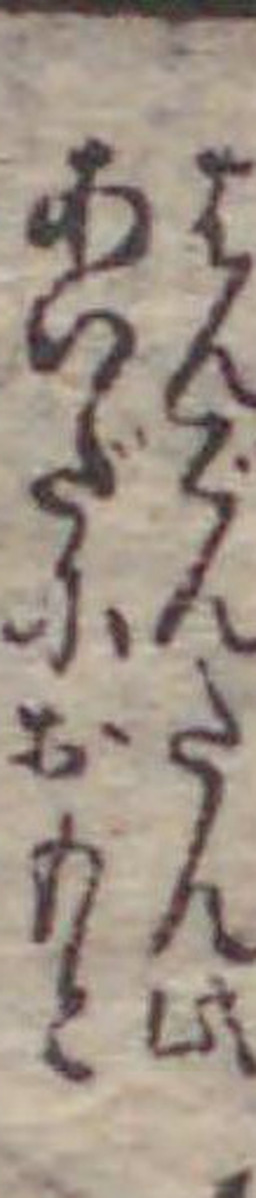あいだにおもと
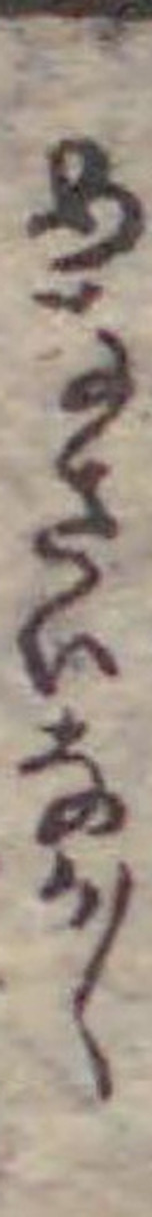めなさいなか〳〵
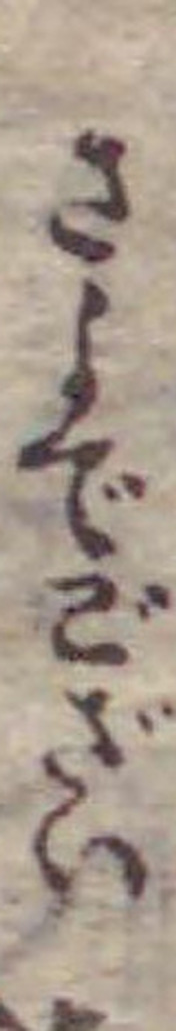さよでござい

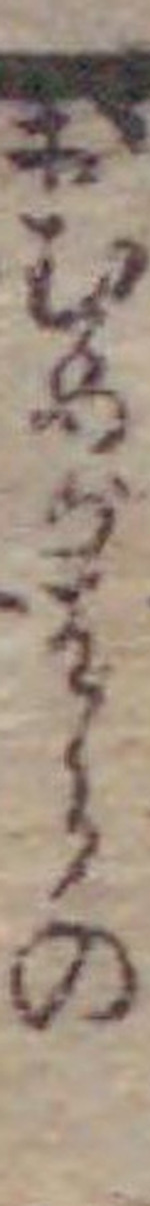おむめがはらの
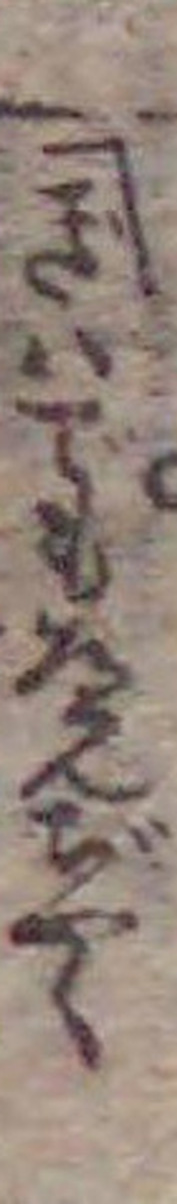〽きいてもへんぢやく
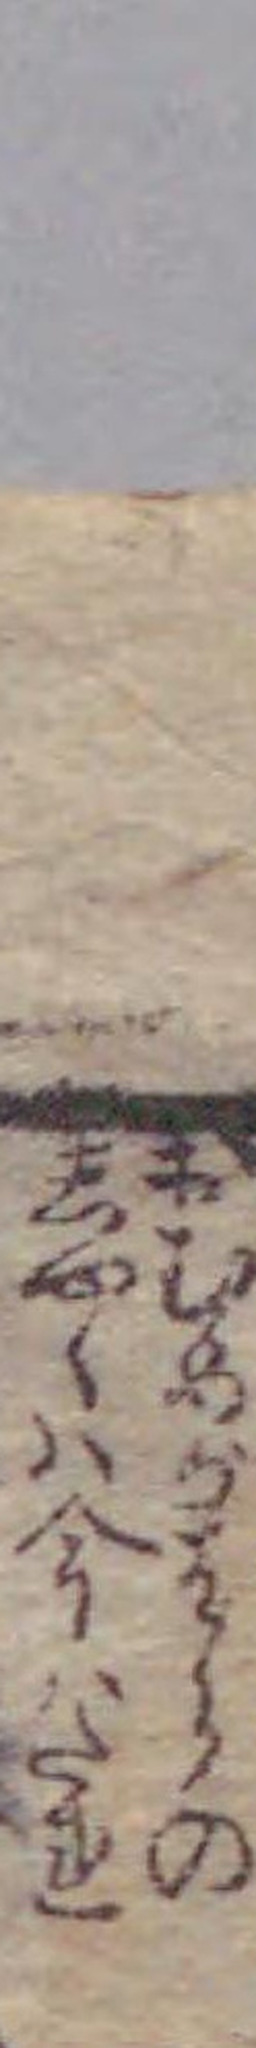しやくは今はたれ
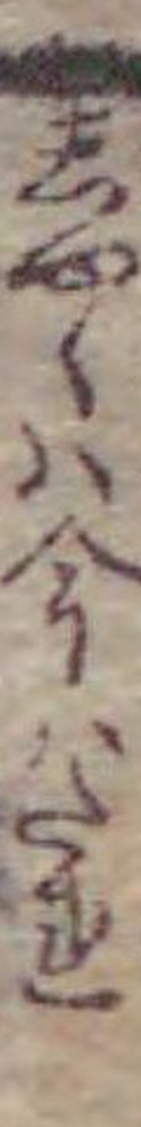しやくは今はたれ
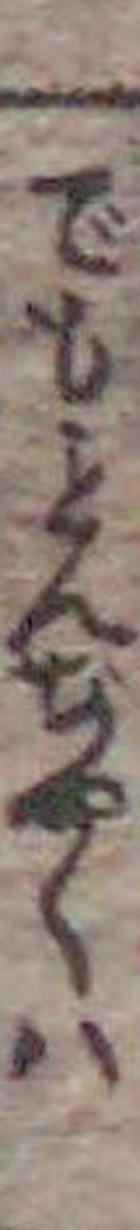でもとんちやくは
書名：鼻下長生薬 : 3巻
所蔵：国立国会図書館 National Diet Library, JAPAN
